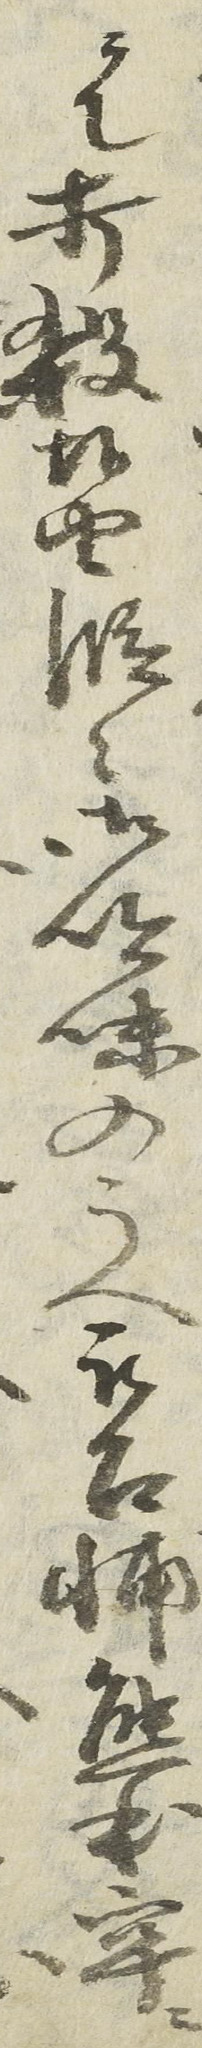ニて打殺候由段々御吟味のうへ被召捕熊本牢ニ
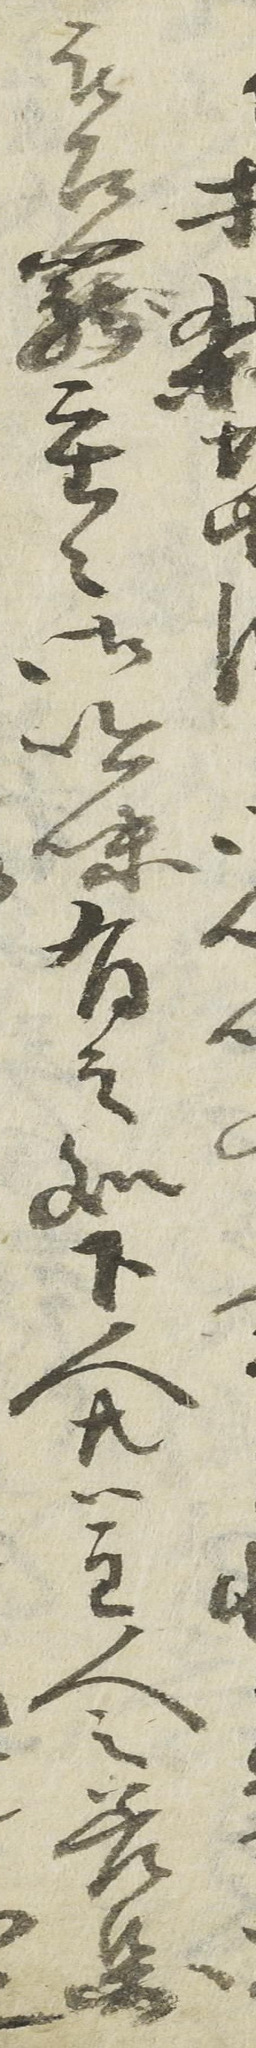被召寵重々御吟味有之処下人共は主人の差図
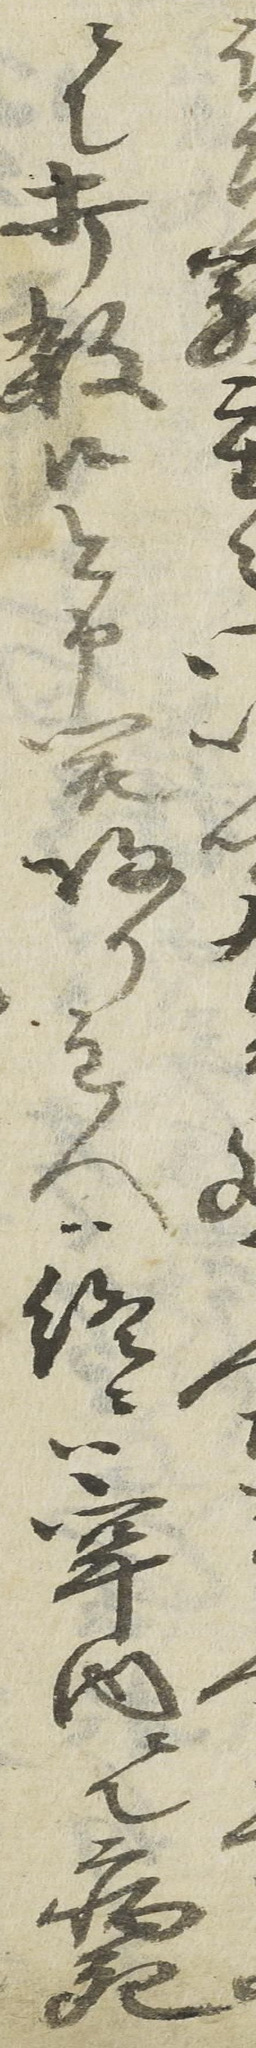ニて打殺候と申開帰り主人は終二は牢内ニて病死
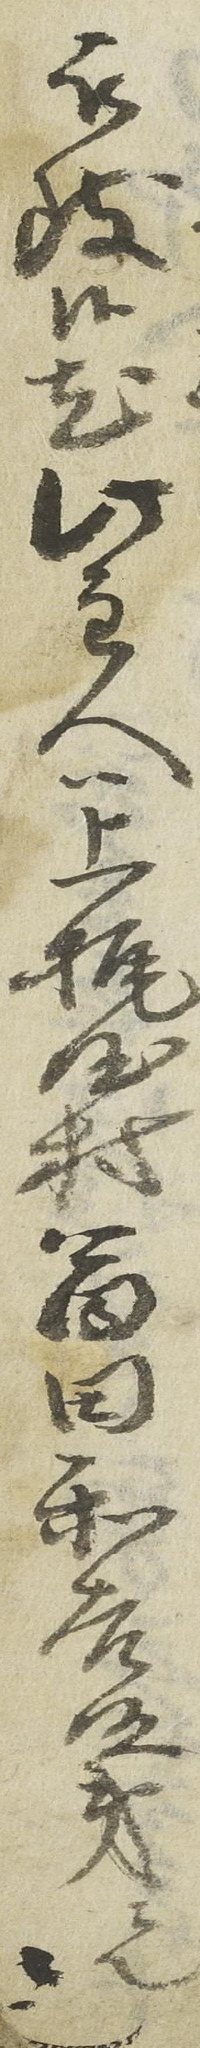被致候尤此主人は上梶屋村富田和吉殿弟ニて

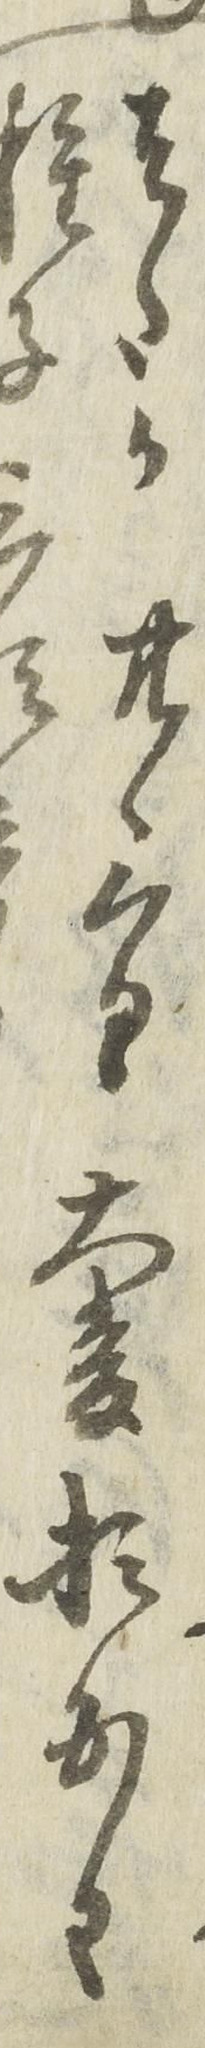はたか同廿三匁大麦拾五匁
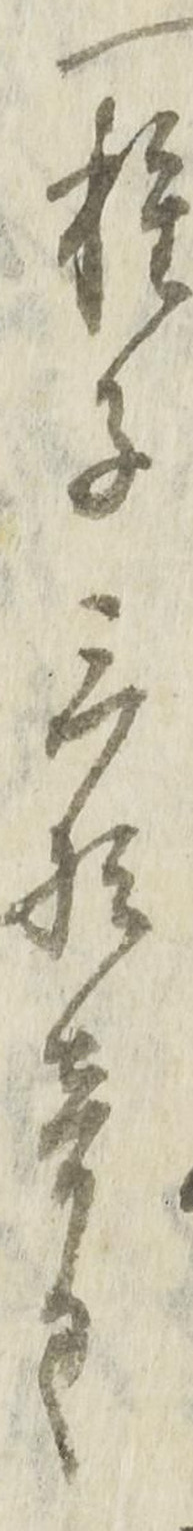種子三拾壱匁
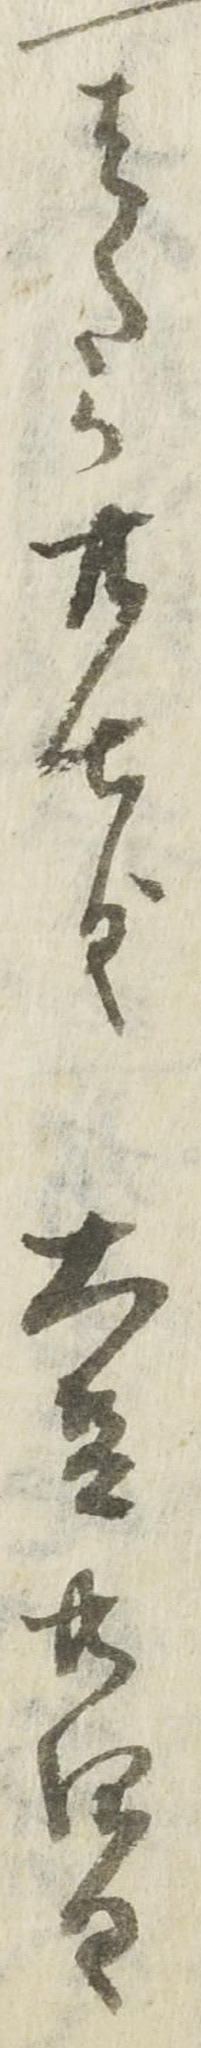はたか廿七分大豆廿四匁
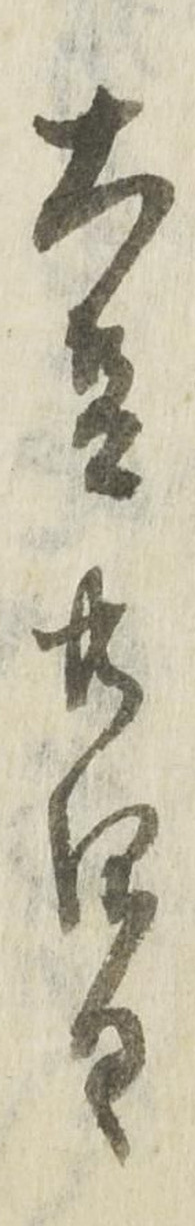同粟廿四匁
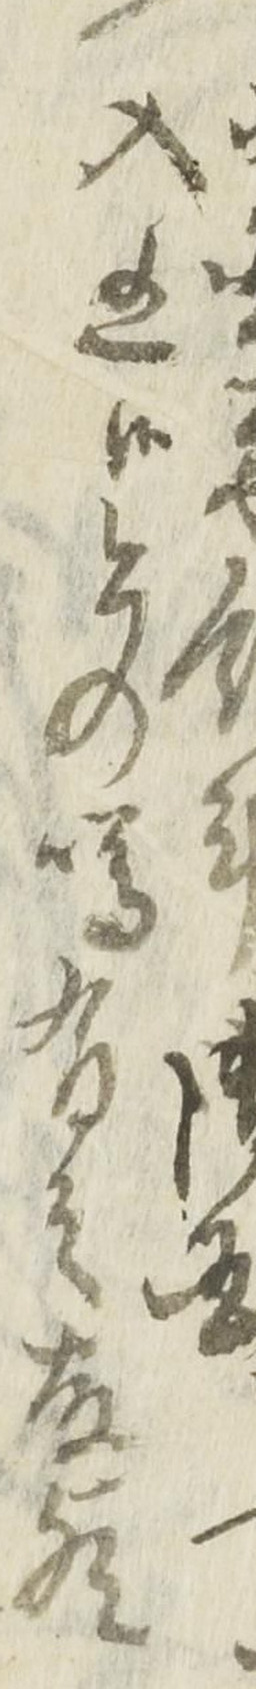入込候との噂有之故歟
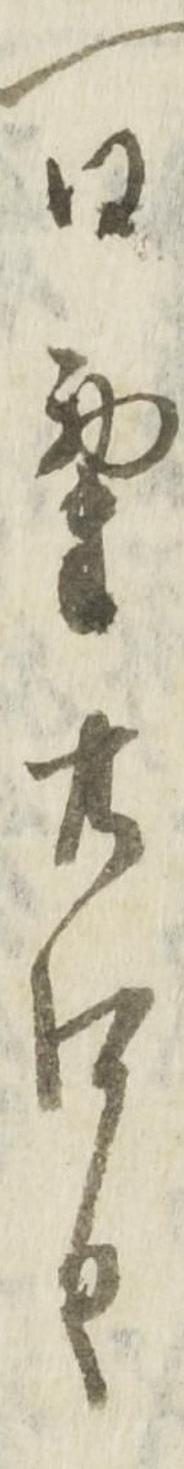同粟廿四匁
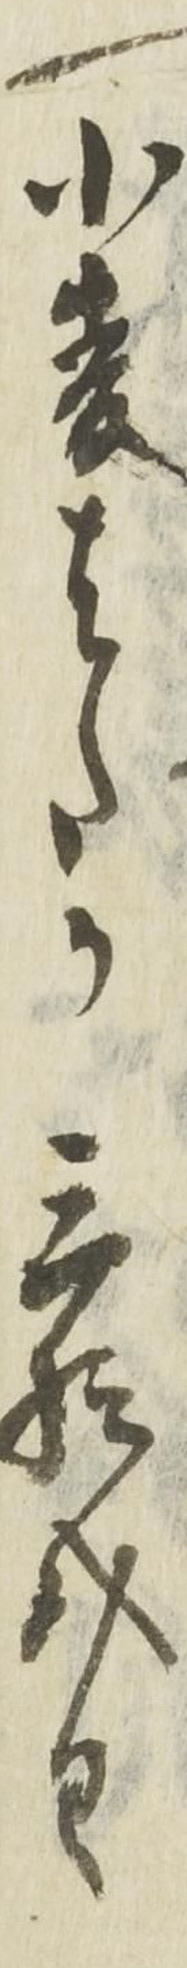小麦はたか三拾弐匁
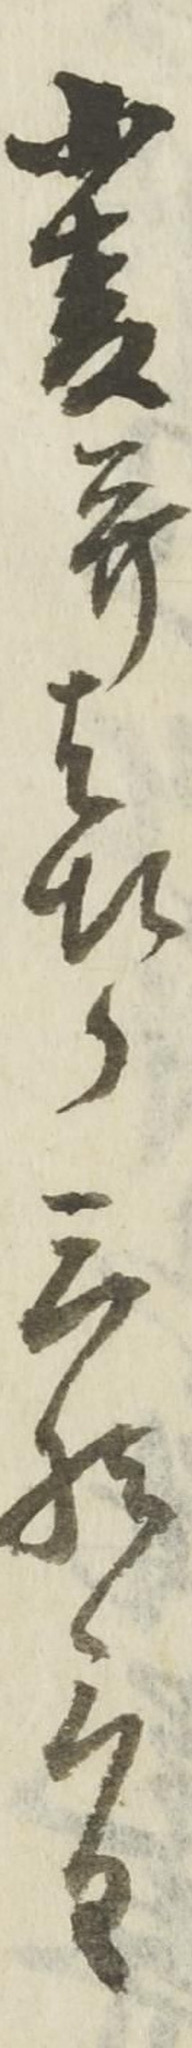小麦并はたか三拾三匁
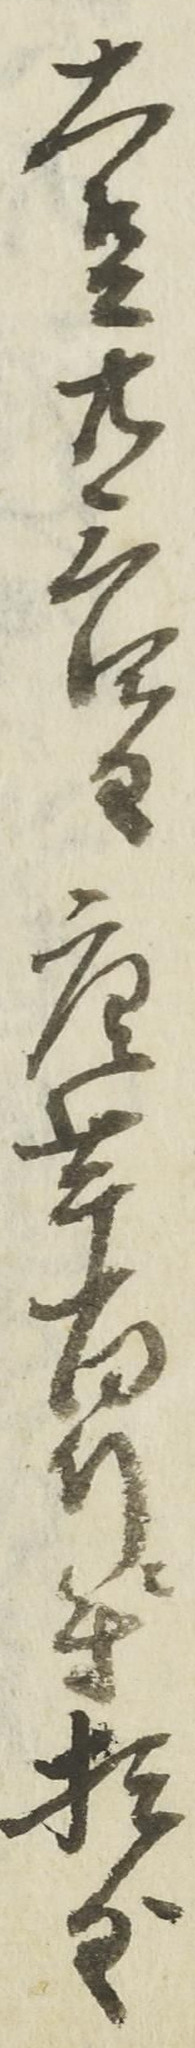大豆廿三四匁唐芋百行ニ付拾匁
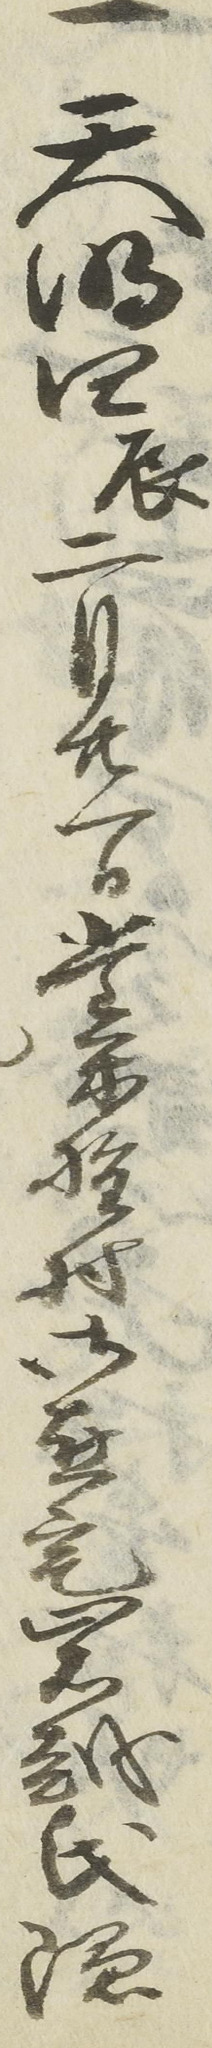一天明四辰二月廿一日堂前勝村御在宅岡越氏隠
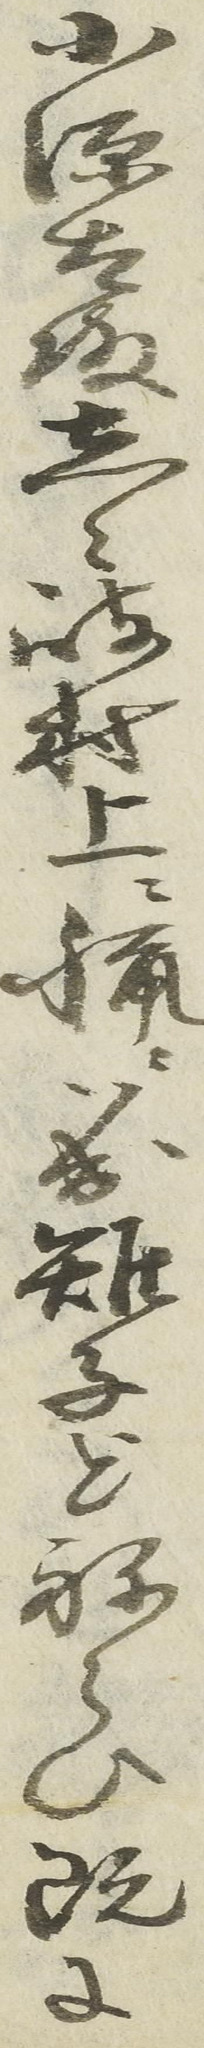小源太殿しゝ崎村上ニ猟ニ御出雉子をねらひ既に
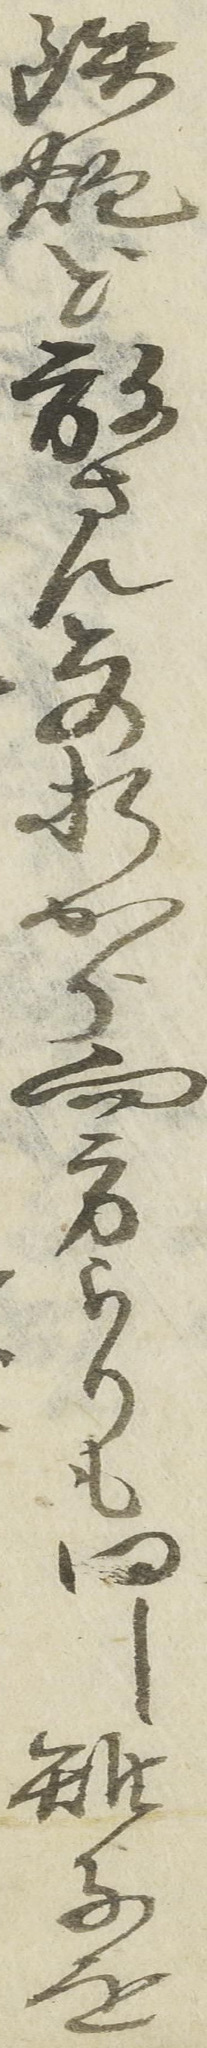鉄炮を放さんとの折から向方よりも同し雉子を
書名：後見笑
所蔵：東京大学地震研究所図書室 Earthquake Research Institute Library, The University of Tokyo, JAPAN
